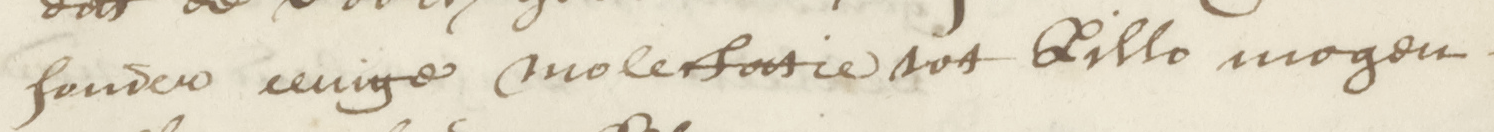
fonder eenige molestatie tot Lillo mogen
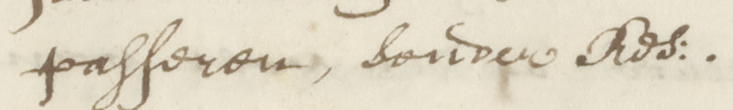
passeren, sonder Res:
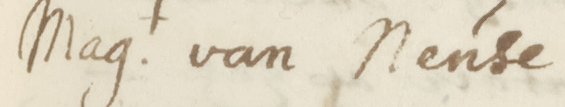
Magt. van Neuse
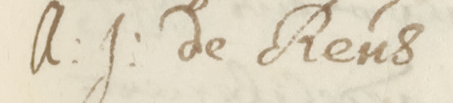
A. J. de Reus
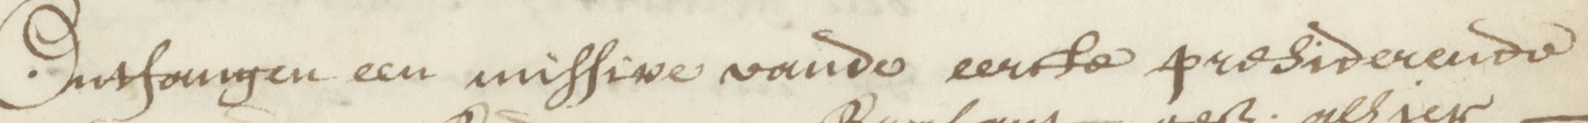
Ontfangen een missive vande eerste presiderende
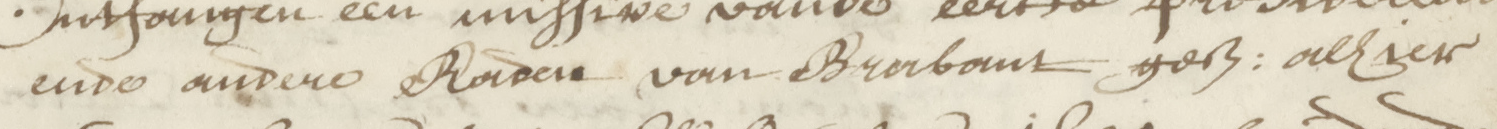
ende andere Raden van Brabant ges: alhier
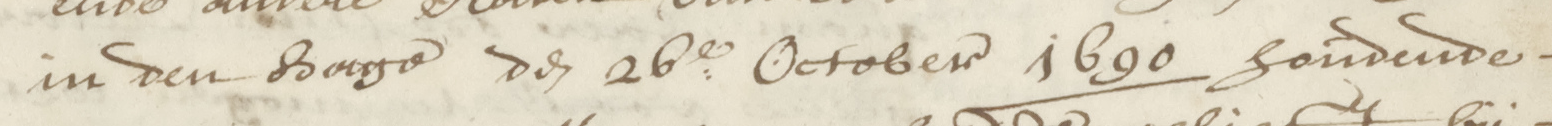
in den Hage den 26e. October 1690 houdende
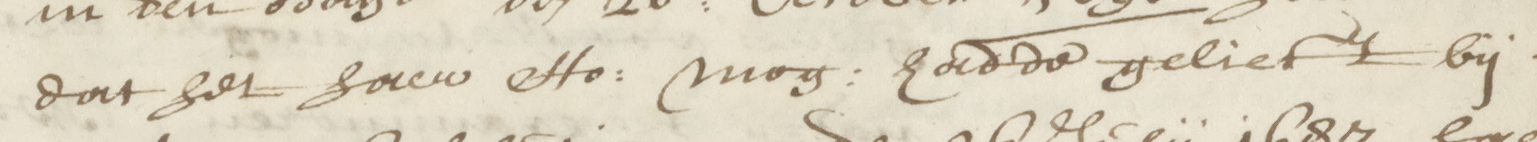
dat het haer Ho: mog: hadde gelieft bij
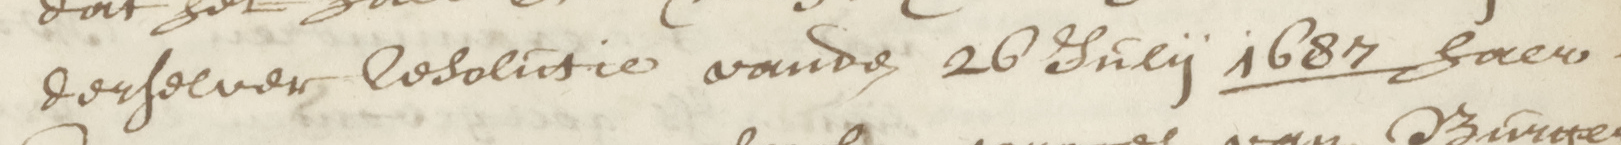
derselver resolutie vanden 26 Julij 1687 haer
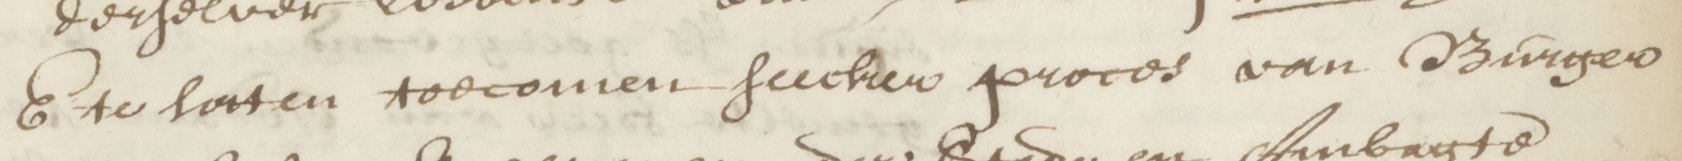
E te laten toecomen seecker proces van Burger
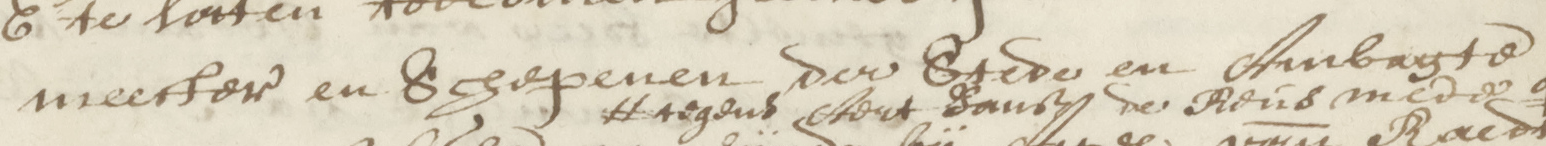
meester en Schepenen der Stede en Ambagte
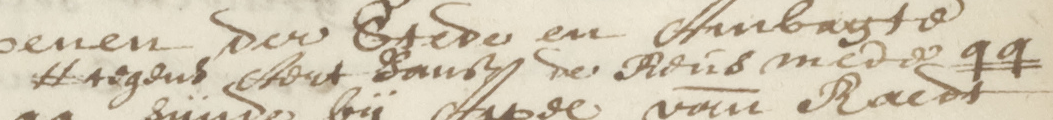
,,tegens Aert Jansz de Reus mede qq
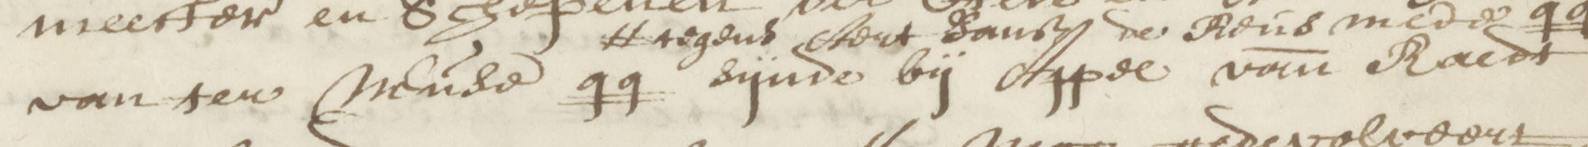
van ter Neuse qq sijnde bij Appel van Raedt
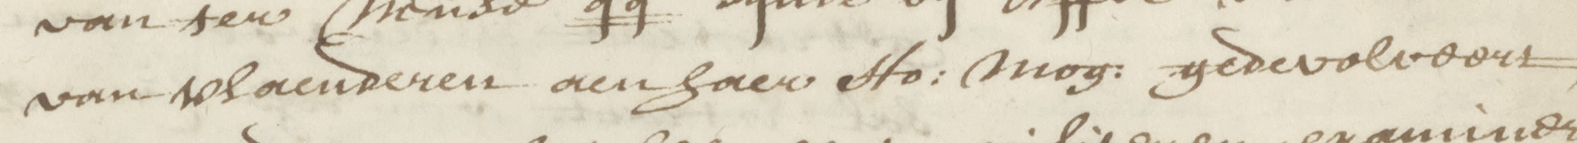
van Vlaenderen aen haer Ho:Mog: gedevolveert
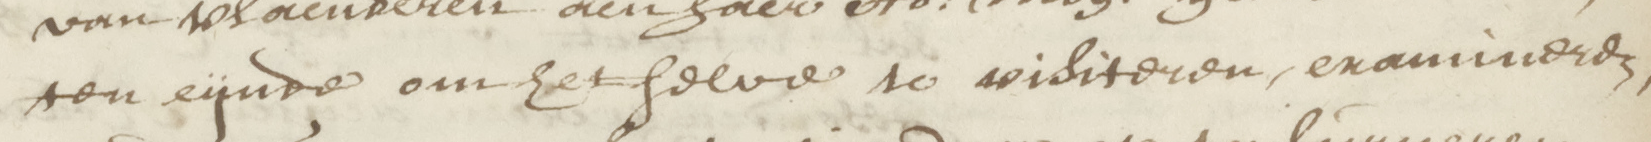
ten eijnde om het selve to visiteren, examineren
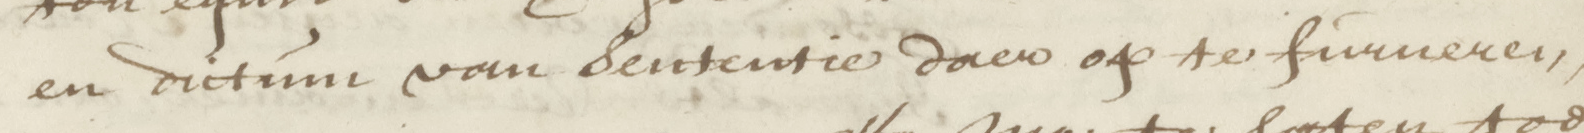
en dictum van sententie daer op te furneren
